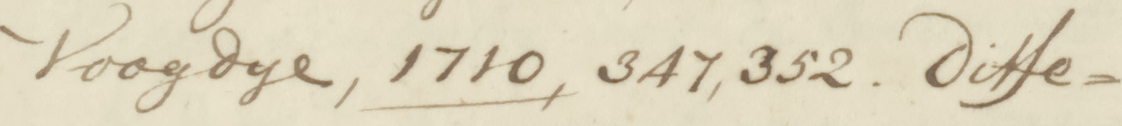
Voogdije, 1710, 347, 352. diffe„
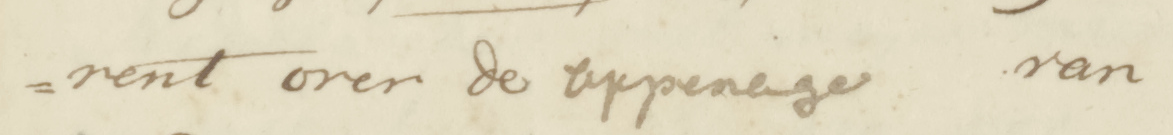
rent over de appenage van
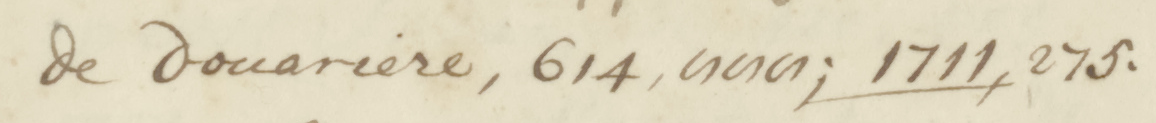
de douariere, 614, 888; 1711, 275.
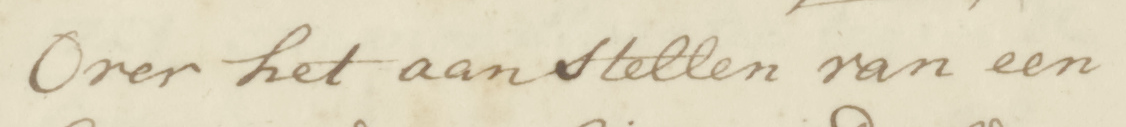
Over het aanstellen van een
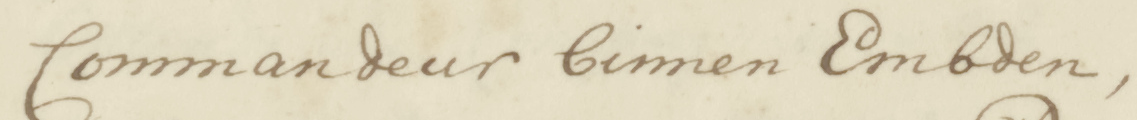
Commandeur binnen Embden,
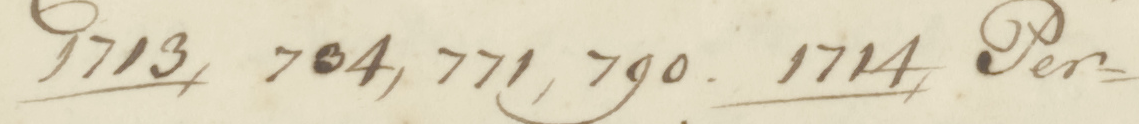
1713, 704, 771, 790. 1714. Per„
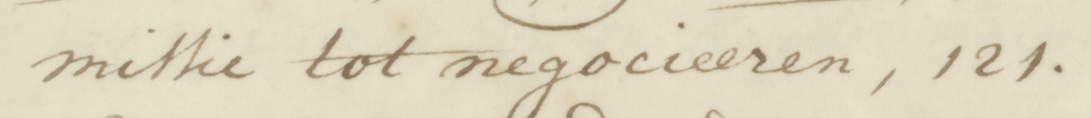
missie tot negocieeren, 121.
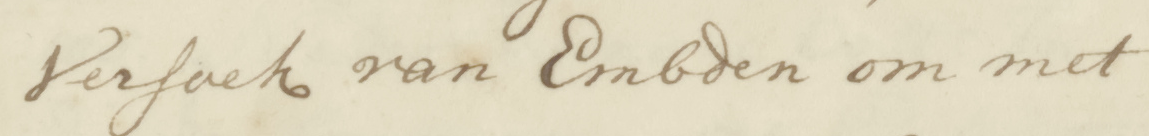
Versoek van Embden om met
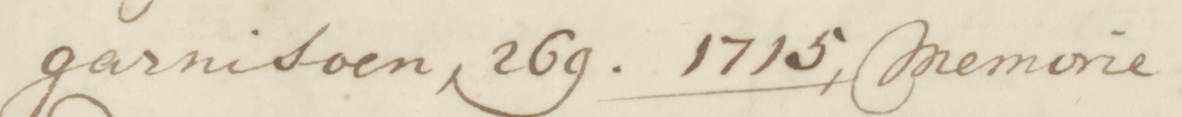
garnisoen, 269. 1715, Memorie
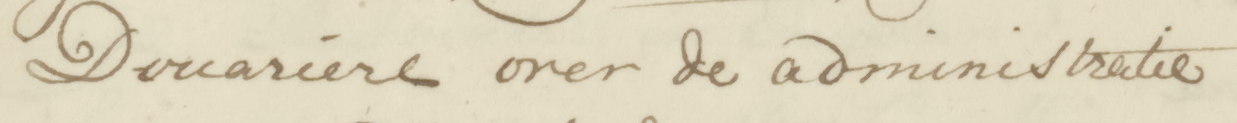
Douariere over de adminstratie
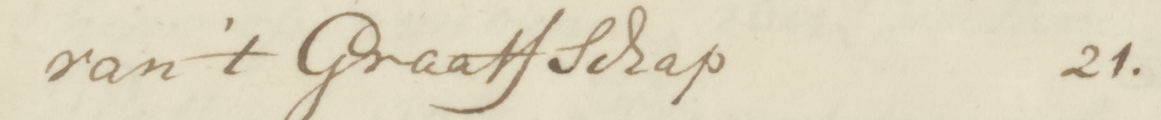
van 't Graeffschap 21.
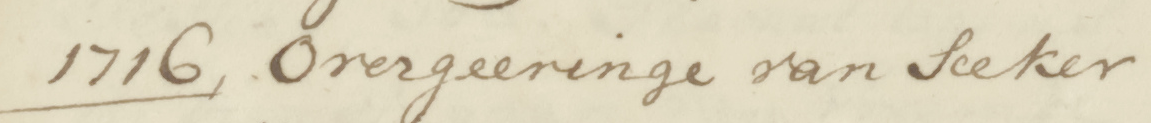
1716, Overgeevinge van seeker
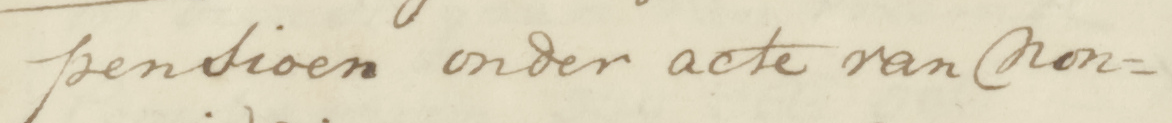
pensioen onder acte van non-
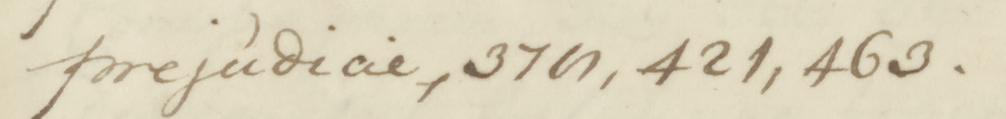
prejudicie, 378, 421, 463. ¬
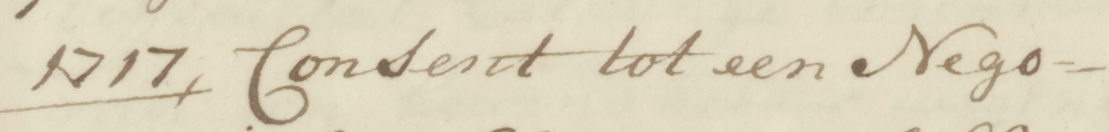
1717. Consent tot een nego„
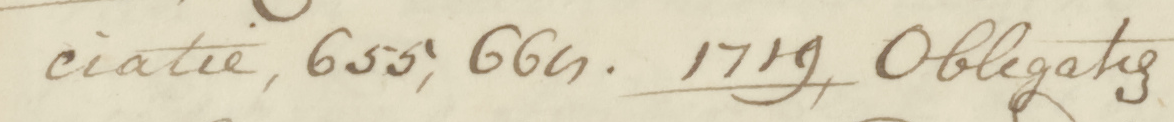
ciatie, 655, 668. 1719, Obiligatien
